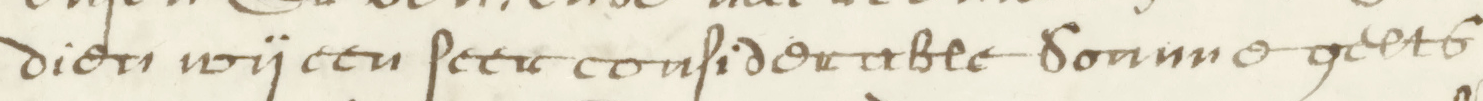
dien wij een seer considerable Somme gelts
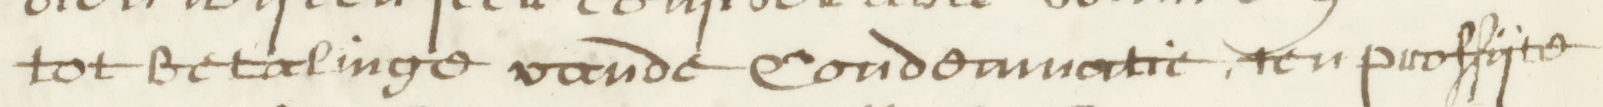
tot betalinge vande Condemnatie, ten proffijte
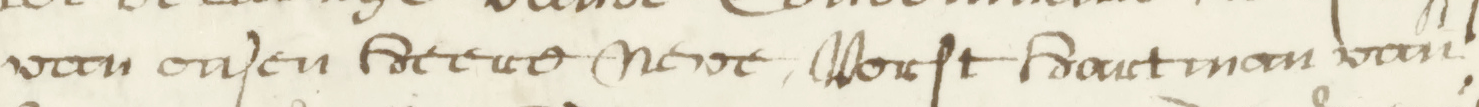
van onsen heere neve, Vorst Hartman van
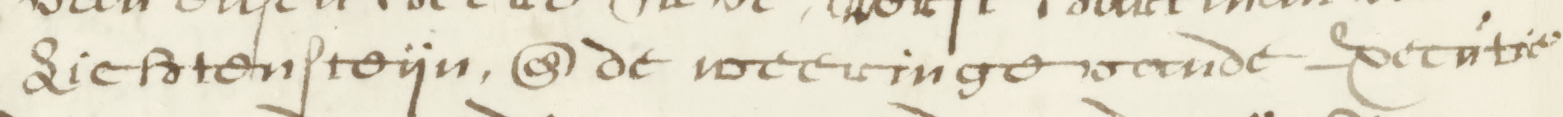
Lichtensteijn, & de weeringe vande Executie
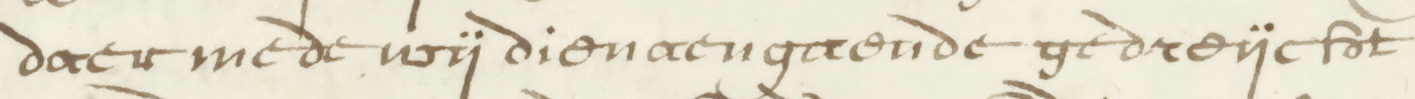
daer mede wij dienaengaende gedreijcht
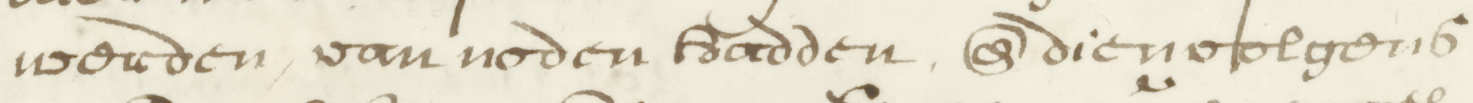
werden, van noden hadden, & dienvolgens
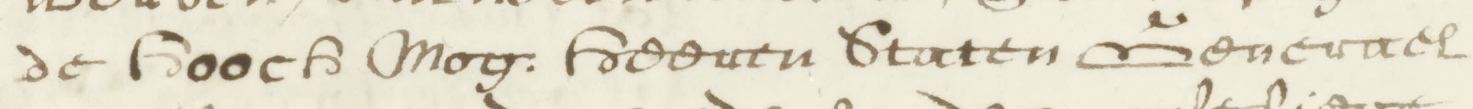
de Hooch Mog: heeren Staten Generael
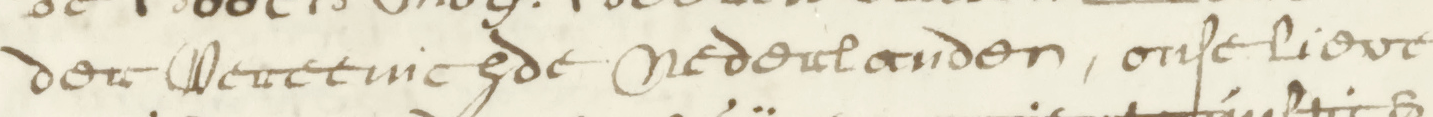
der Vereenichde Nederlanden, onse lieve
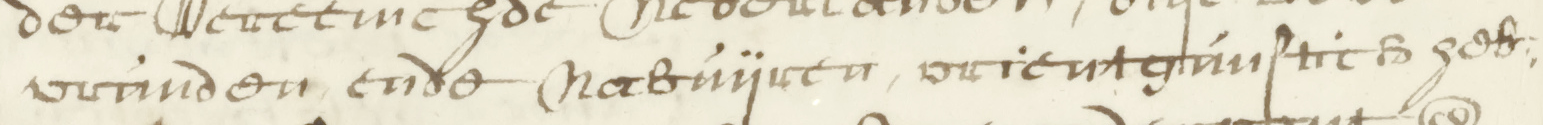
vrunden ende nabuijren, vrientgunstich heb„
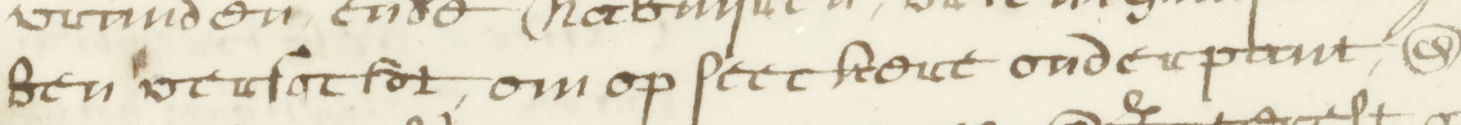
ben versocht om op seeckere onderpant, &
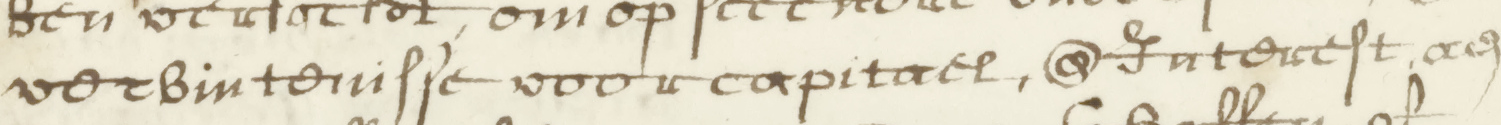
verbintenisse voor capitael, & Interest aen
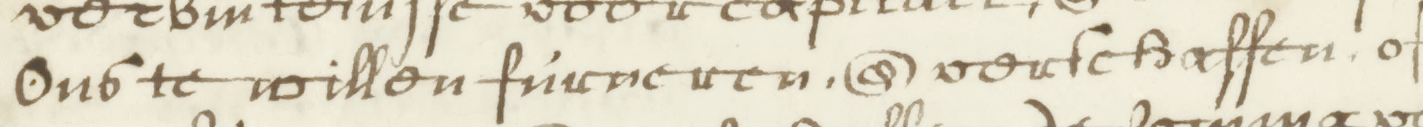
ons te willen furneren, & verschaffen. of
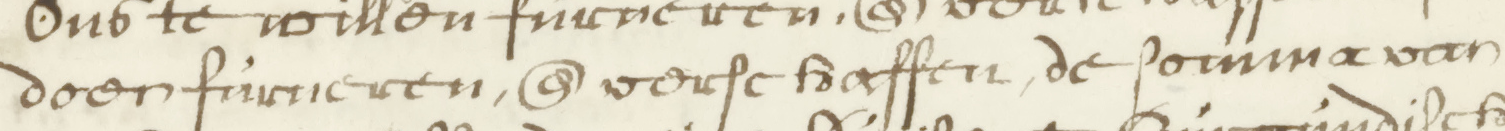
doen furneren, & verschaffen, de somma van
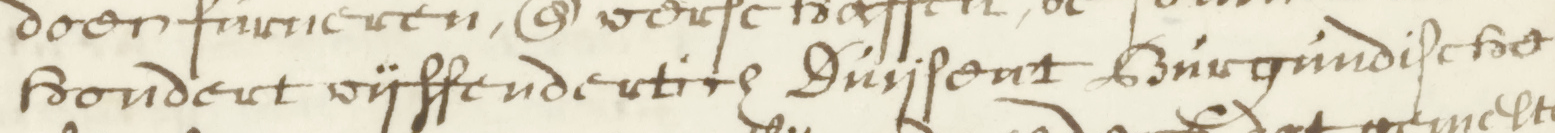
hondert vijffendertich Duijsent Burgundische
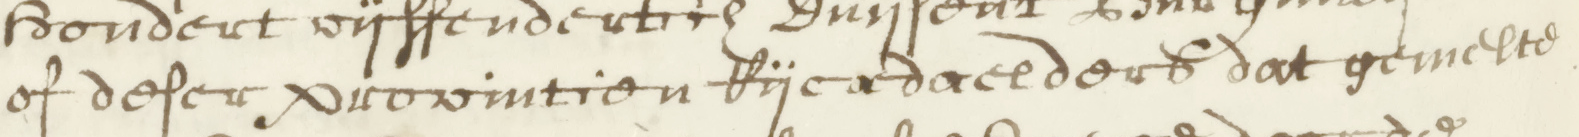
of deser provintien Rijcxdaelders dat gemelte
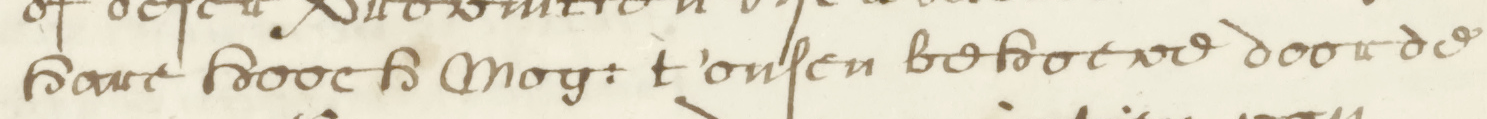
hare Hooch Mog: t'onsen behoeve door de
